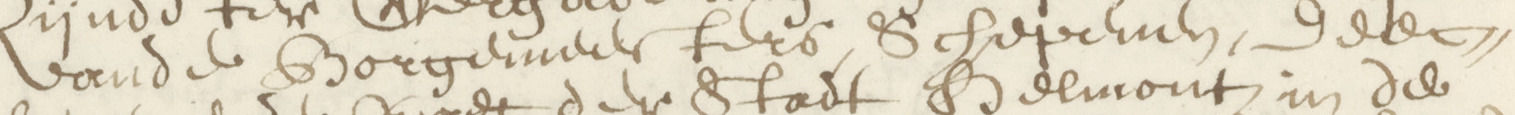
vande Borgemeesters, Schepenen, Deec„
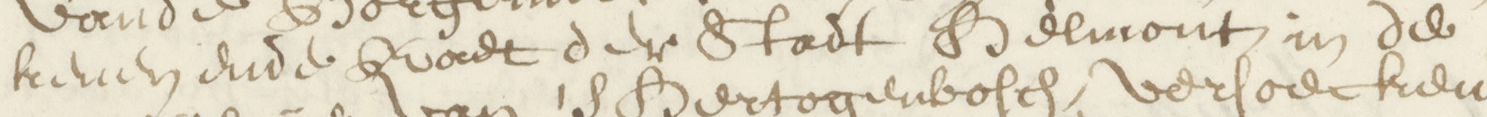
kenen ende Raet der Stadt Helmont, in de
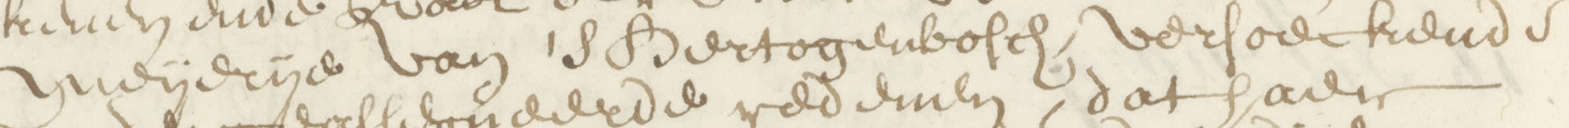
Meijerije van ‛s Hertogenbosch, versoeckende
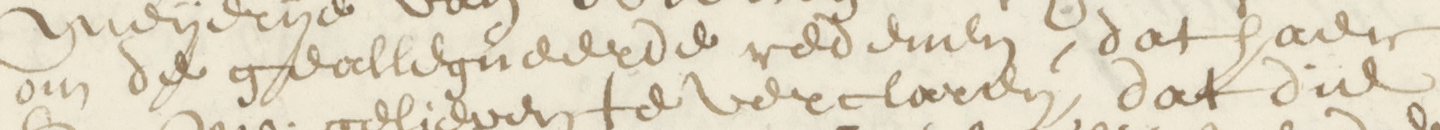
om de geallegueerde redenen, dat haer
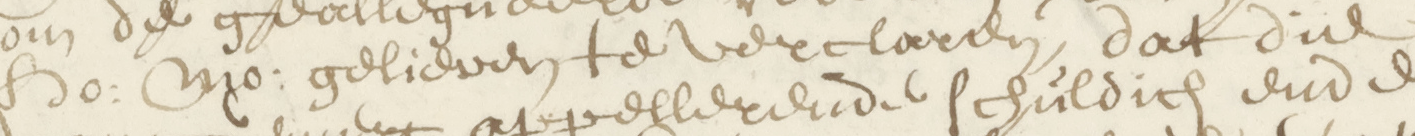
Ho:Mo: gelieven te verclaren, dat die
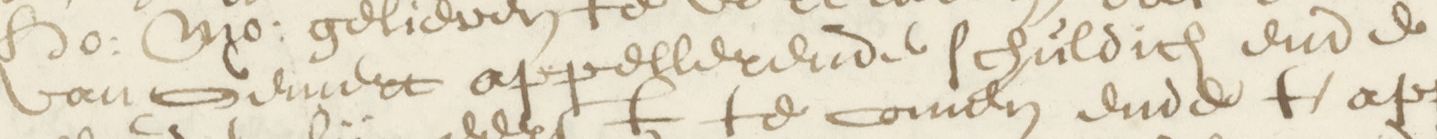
van Gemert appellerende schuldich ende
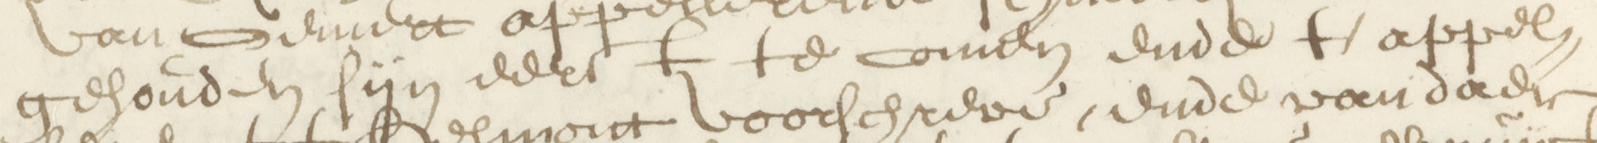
gehouden sijn eerst te comen ende t‛appel„
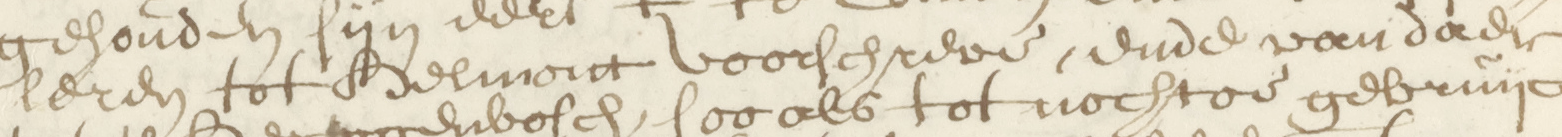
leren tot Helmont voorschreve, ende van daer
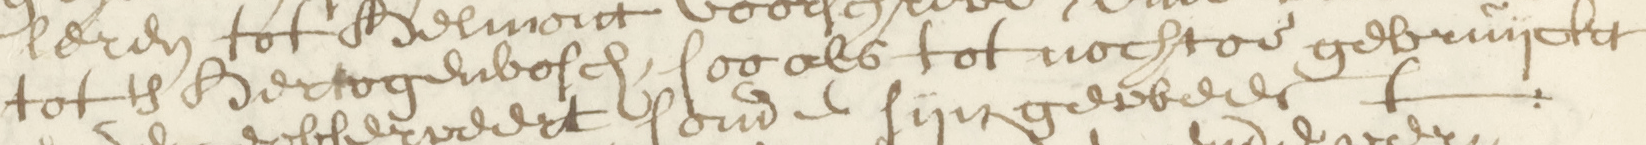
tot ‛s Hertogenbosch, soo als tot nochtoe gebruijckt
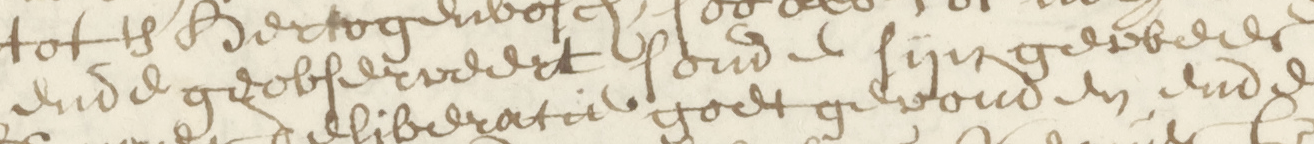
ende geobserveert soude sijn geweest.
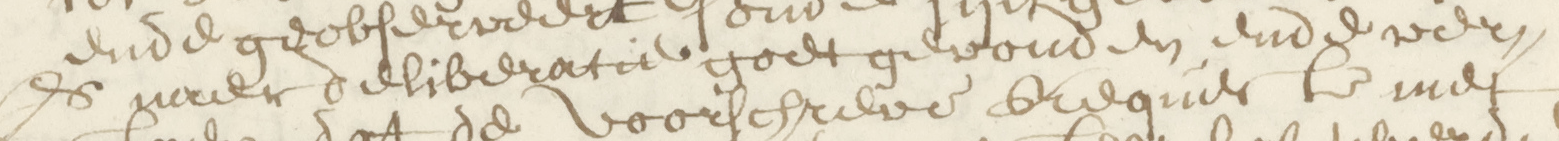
Is naer deliberatie goetgevonden ende ver„
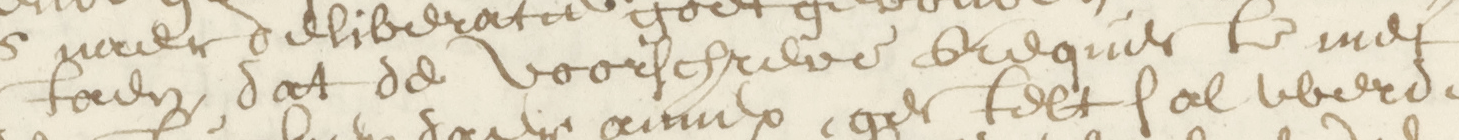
staen, dat de voorschreve Requeste met
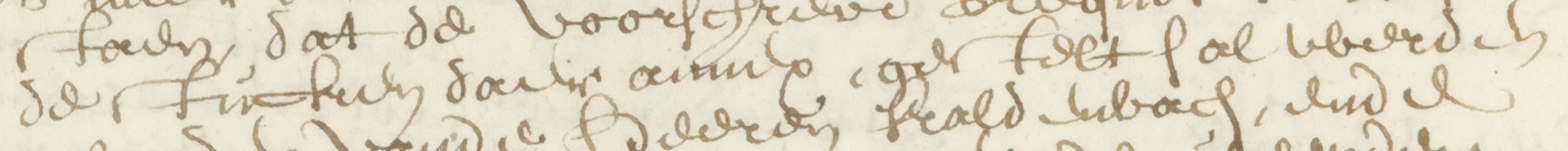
de stucken daer annex, gestelt sal werden
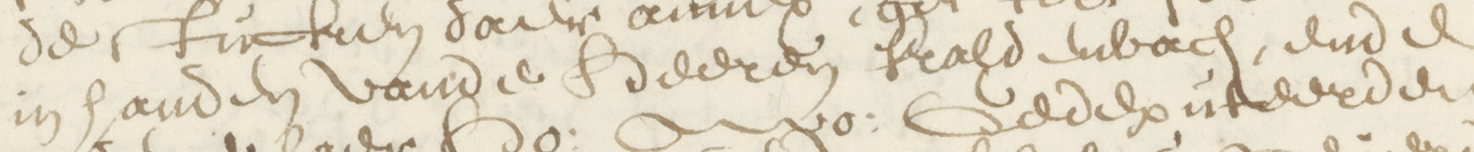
in handen vande Heeren Kaldenbach, ende
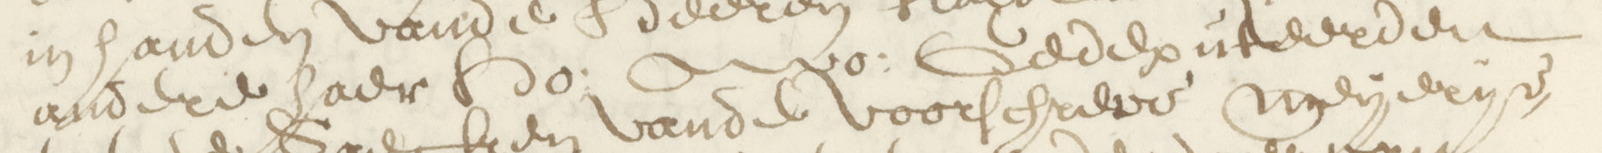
andere haer Ho:Mo: Gedeputeerden
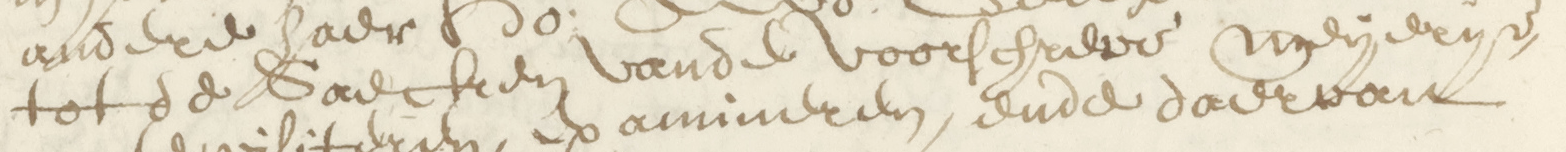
tot de Saecken vande voorschreve Meijerije,
